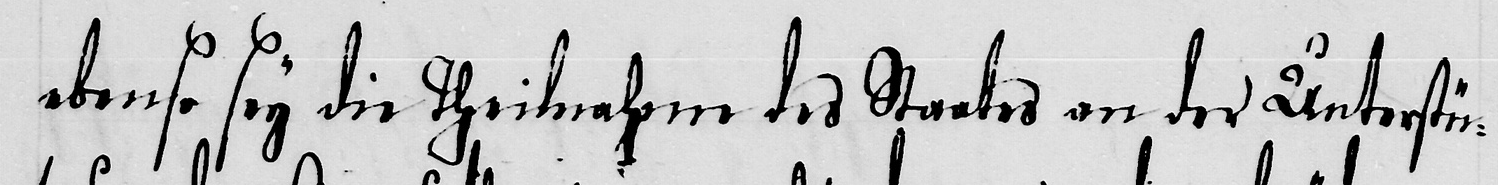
ebenso sey die Theilnahme des Staates an der Unterstü¬
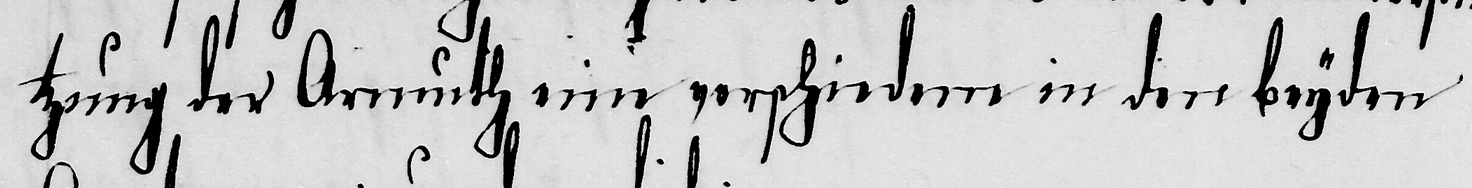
tzung der Armuth eine verschiedene in den beyden
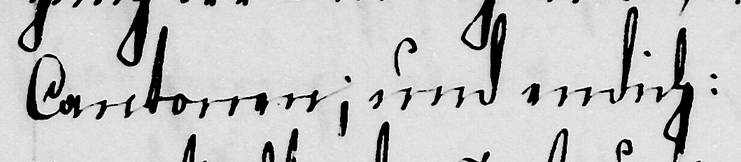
Cantonen; und endich
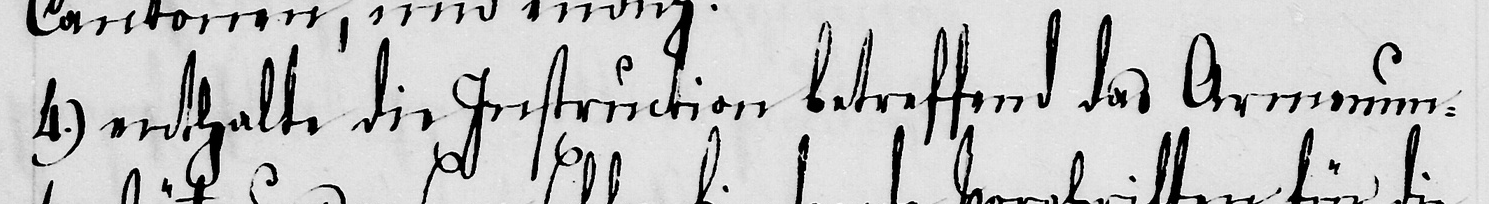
4.) enthalte die Instruction betreffend das Armenun¬
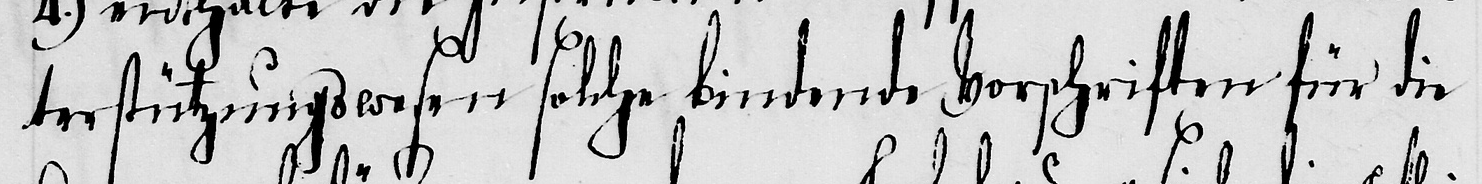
terstützungswesen solche bindende Vorschriften für die
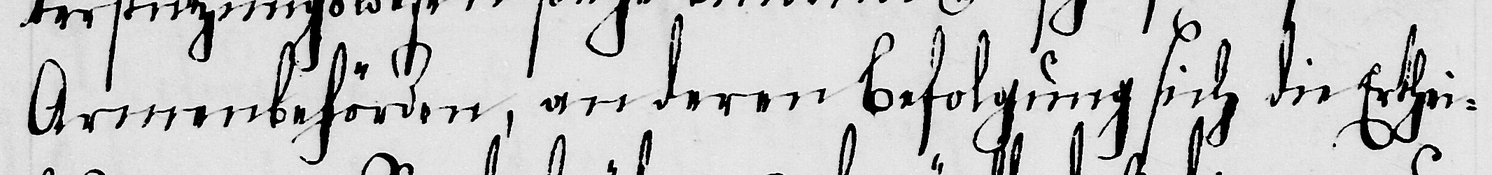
Armenbehörden, an deren Befolgung sich die Erthe¬
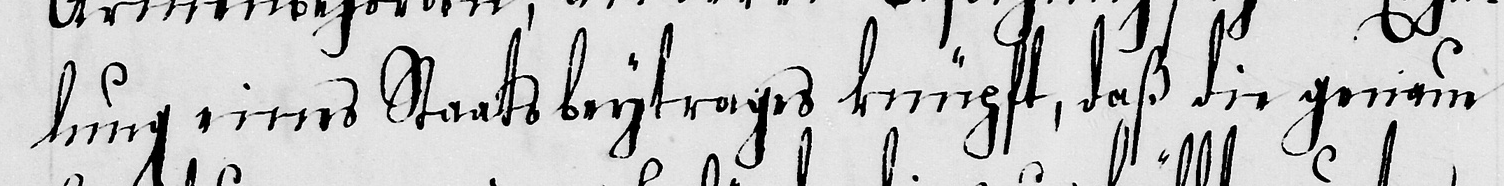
ilung eines Staatsbeytrages knüpft, daß die genaue
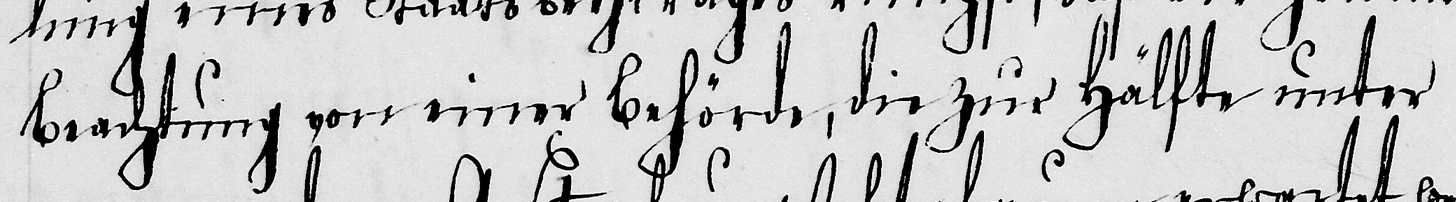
Beachtung von einer Behörde, die zur Hälfte unter
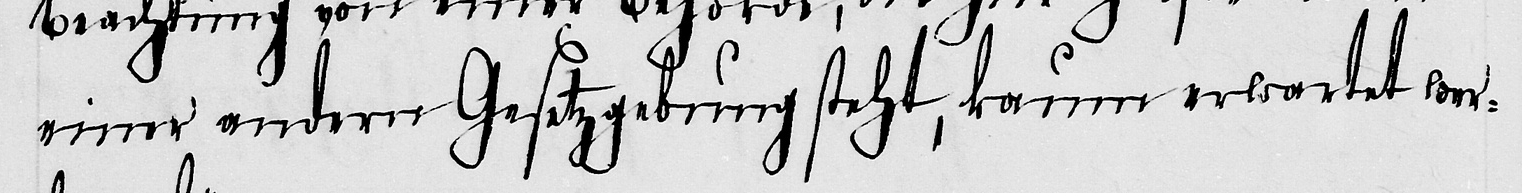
einer andern Gesetzgebung steht, kaum erwartet wer¬
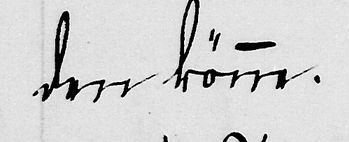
den könne.
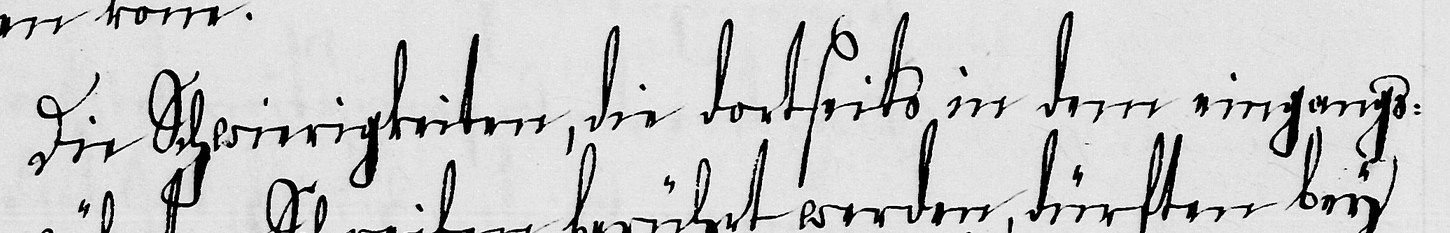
Die Schwierigkeiten, die dortseits in dem eingangs¬
